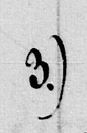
3.)
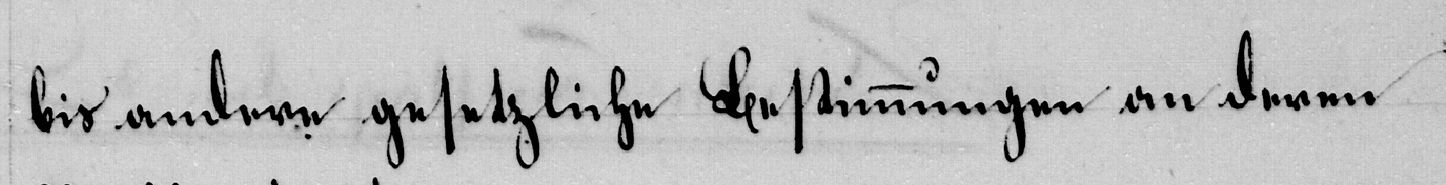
bis andere gesetzliche Bestimmungen an deren
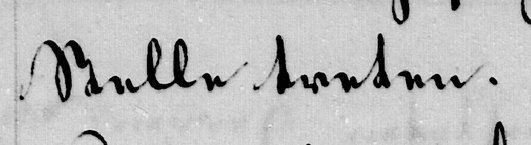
Stelle treten.
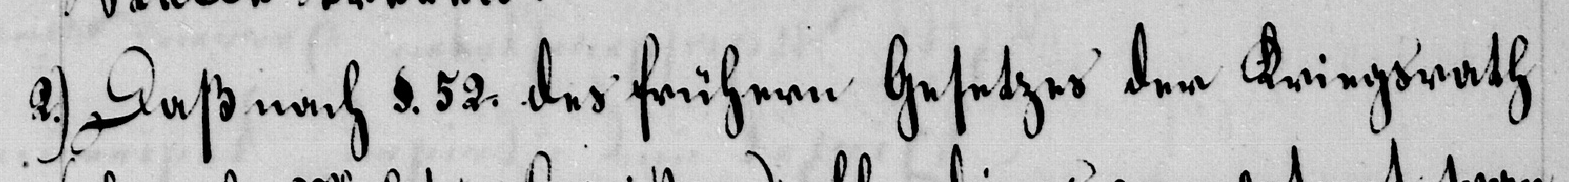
2.) Daß nach §. 52. des frühern Gesetzes der Kriegsrath
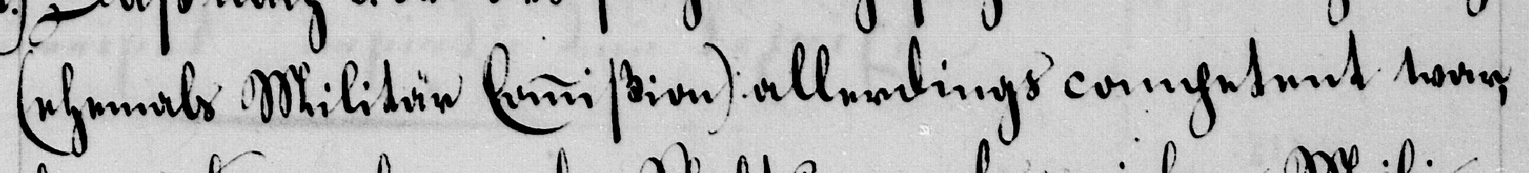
(ehemals Militär-Commißion) allerdings competent war,
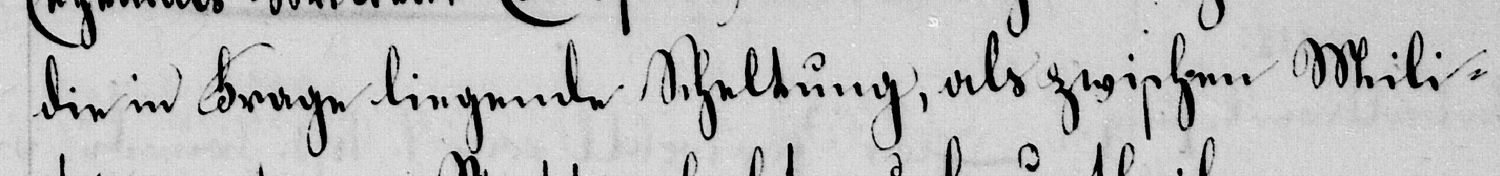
die in Frage liegende Scheltung, als zwischen Mili¬
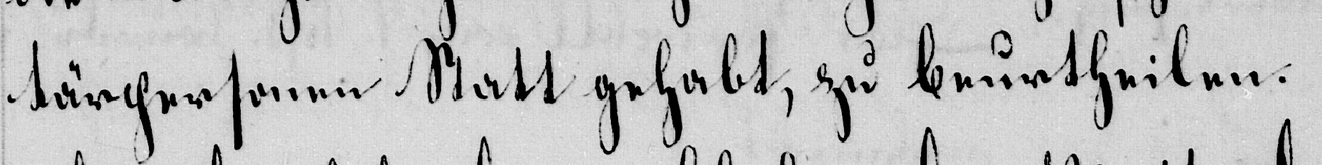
tärpersonen Statt gehabt, zu beurtheilen.
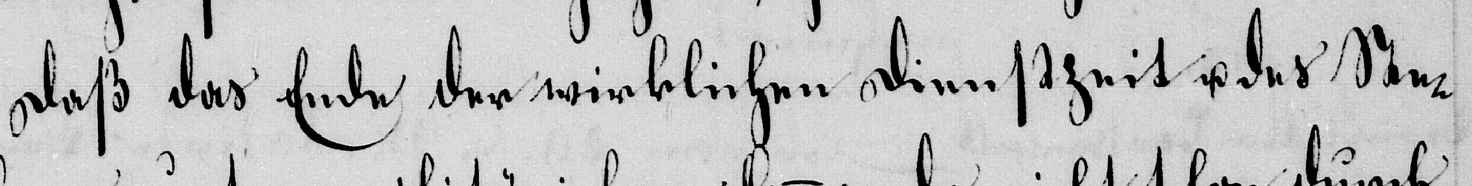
Daß das Ende der wirklichen Dienstzeit u. des Ste¬
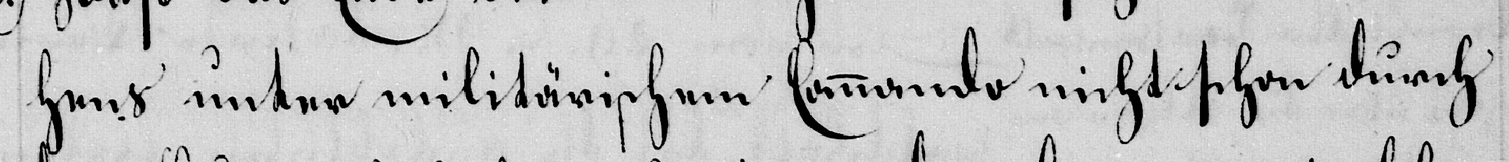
hens unter militärischem Commando nicht schon durch
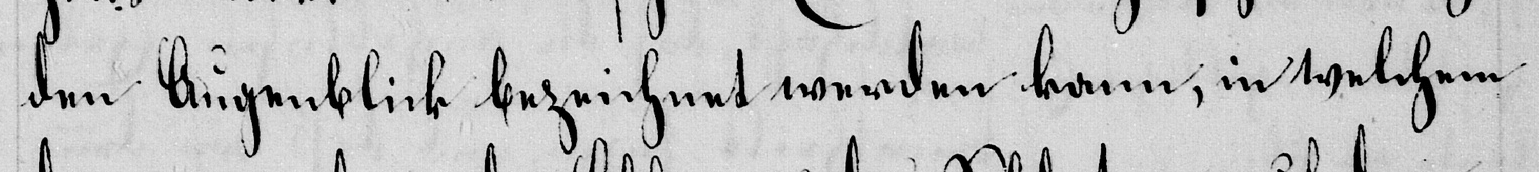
den Augenblick bezeichnet werden kann, in welchem
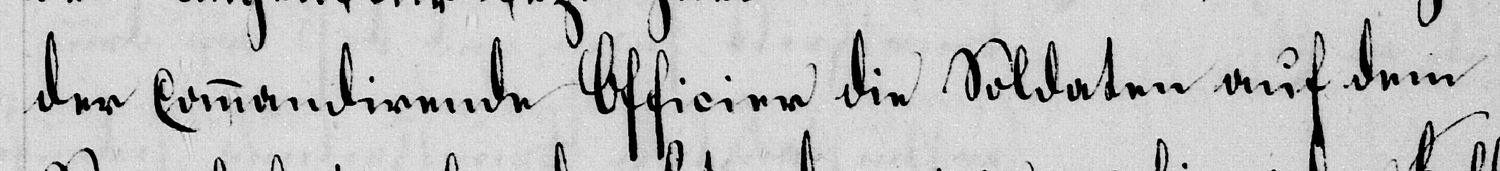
der commandirende Officier die Soldaten auf dem
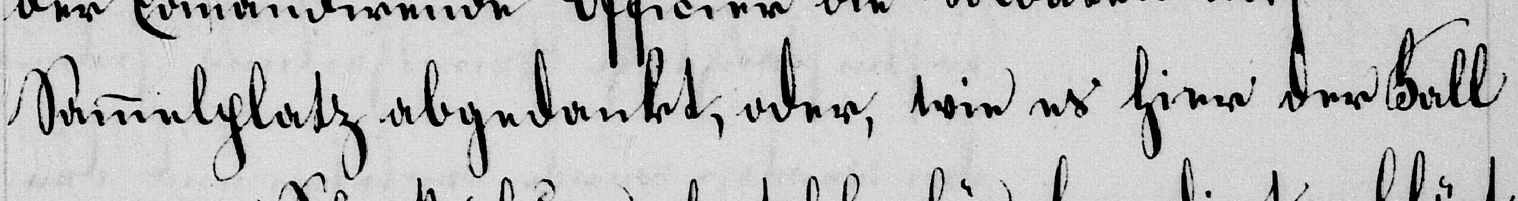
Sammelplatz abgedankt, oder, wie es hier der Fall
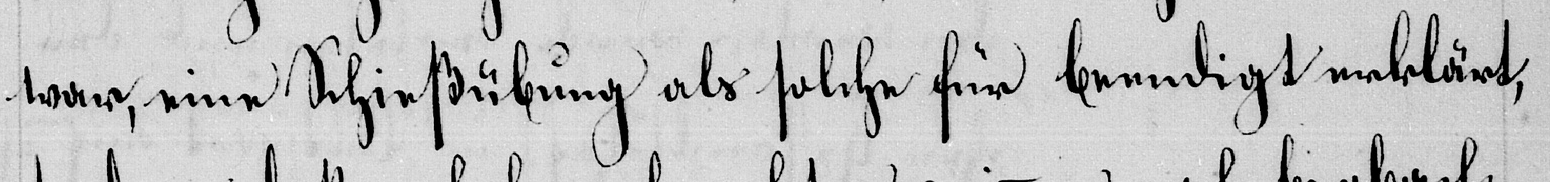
war, eine Schießübung als solche für beendigt erklärt,
